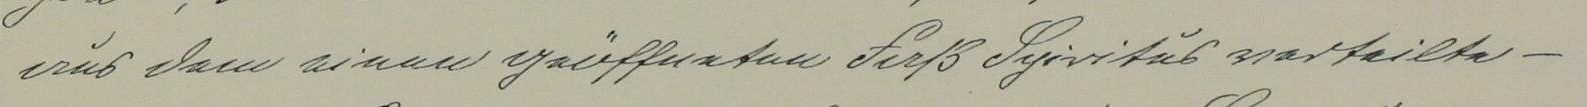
aus dem einen geöffneten Faß Spiritus verteilte –
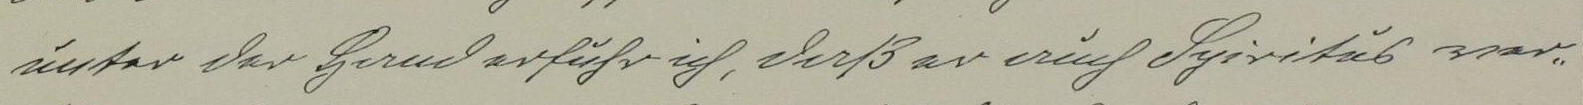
unter der Hand erfuhr ich, daß er auch Spiritus ver-
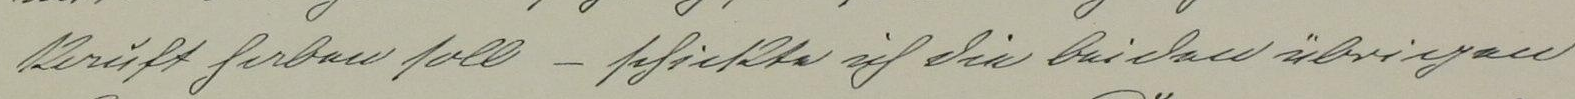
kauft haben soll – schickte ich die beiden übrigen
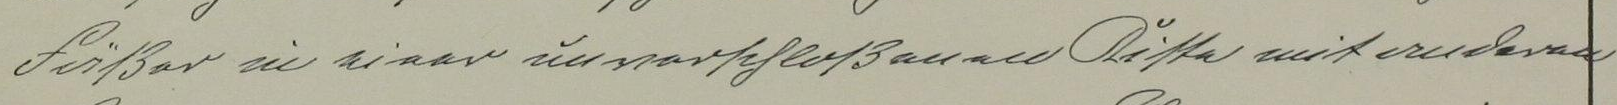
Fäßer in einer unverschloßenen Kiste mit anderen
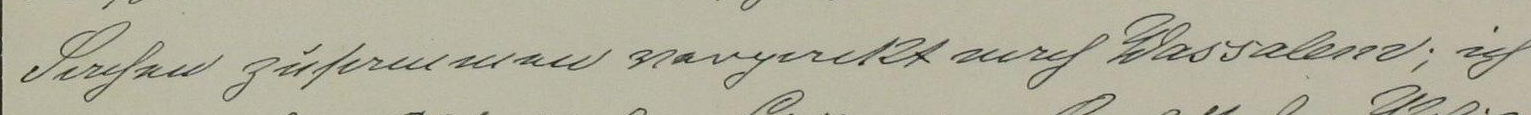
Sachen zusammen verpackt nach Wassalem; ich
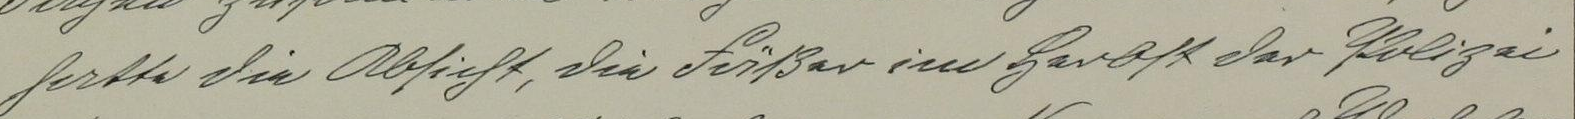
hatte die Absicht, die Fäßer im Herbst der Polizei
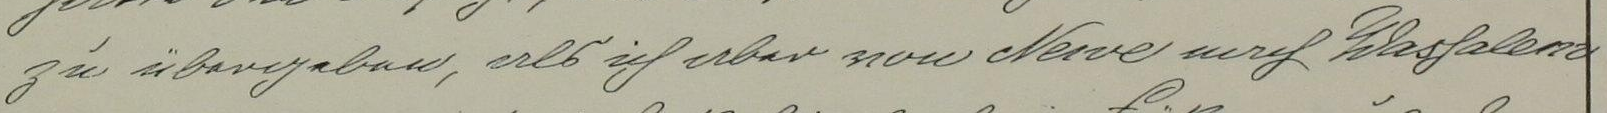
zu übergeben, als ich aber von Newe nach Wassalem
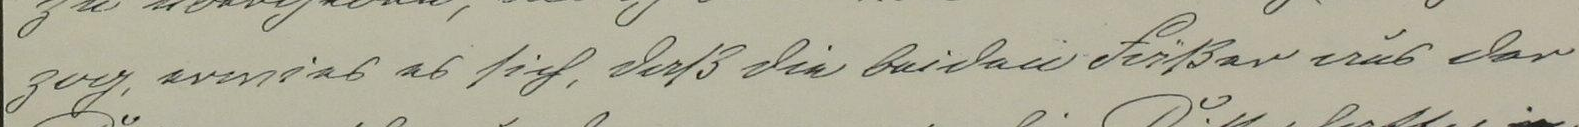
zog, erwies es sich, daß die beiden Fäßer aus der
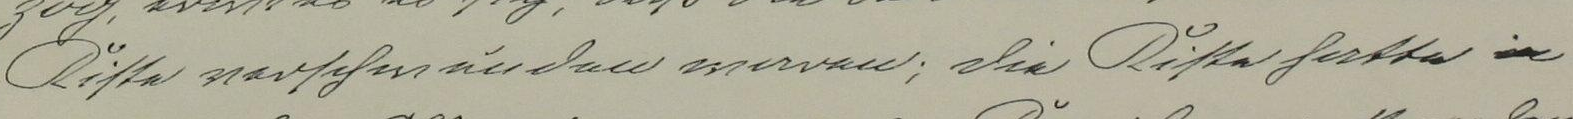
Kiste verschwunden waren; die Kiste hatte in
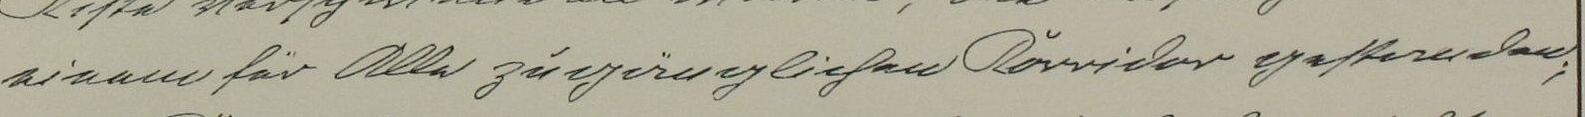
einem für Alle zugänglichen Korridor gestanden;
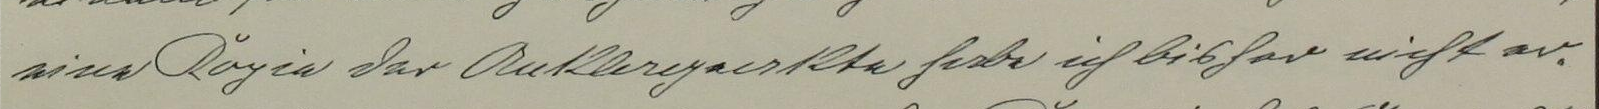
eine Kopie der Anklageakte habe ich bisher nicht er-
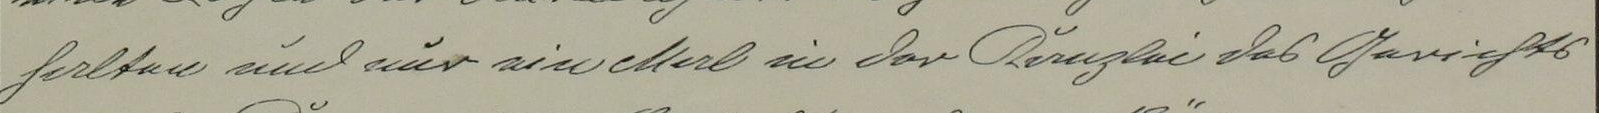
halten und nur ein Mal in der Kanzlei des Gerichts
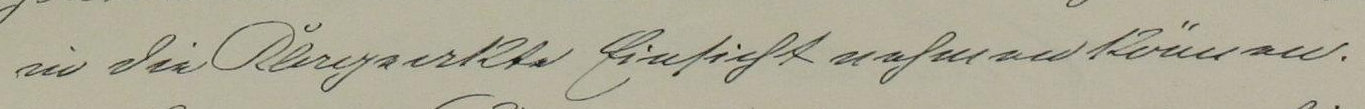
in die Klageakte Einsicht nehmen können.
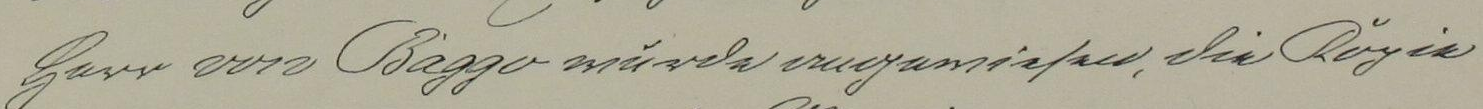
Herr von Baggo wurde angewiesen, die Kopie
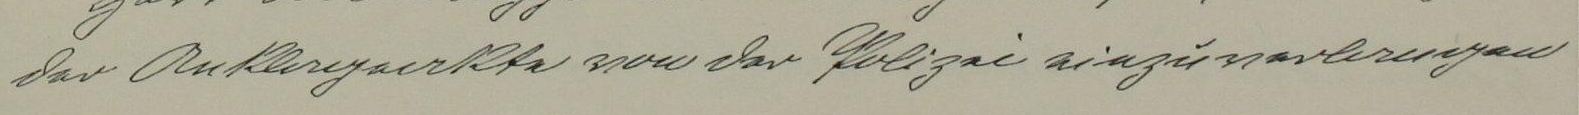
der Anklageakte von der Polizei einzuverlangen
